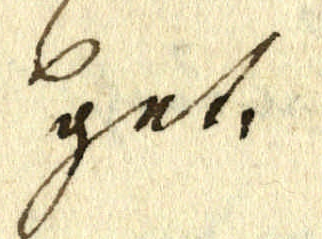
get.
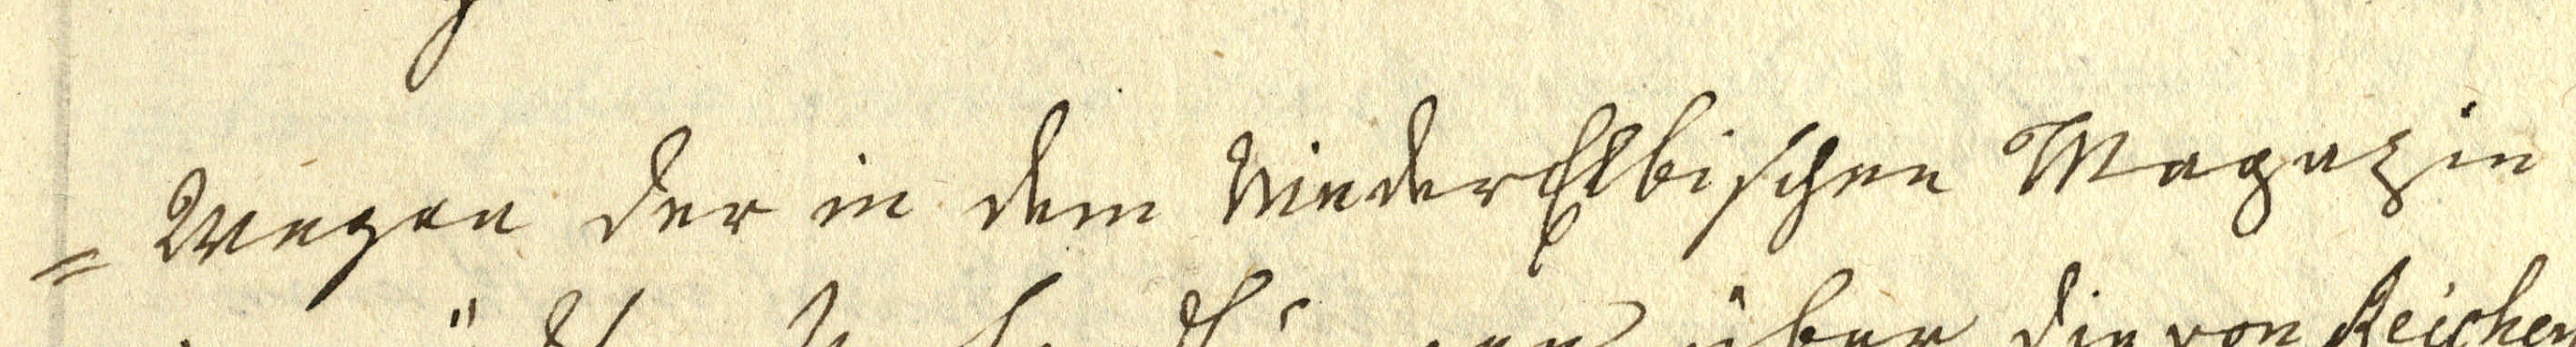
Wegen der in dem NiederElbischen Magazin
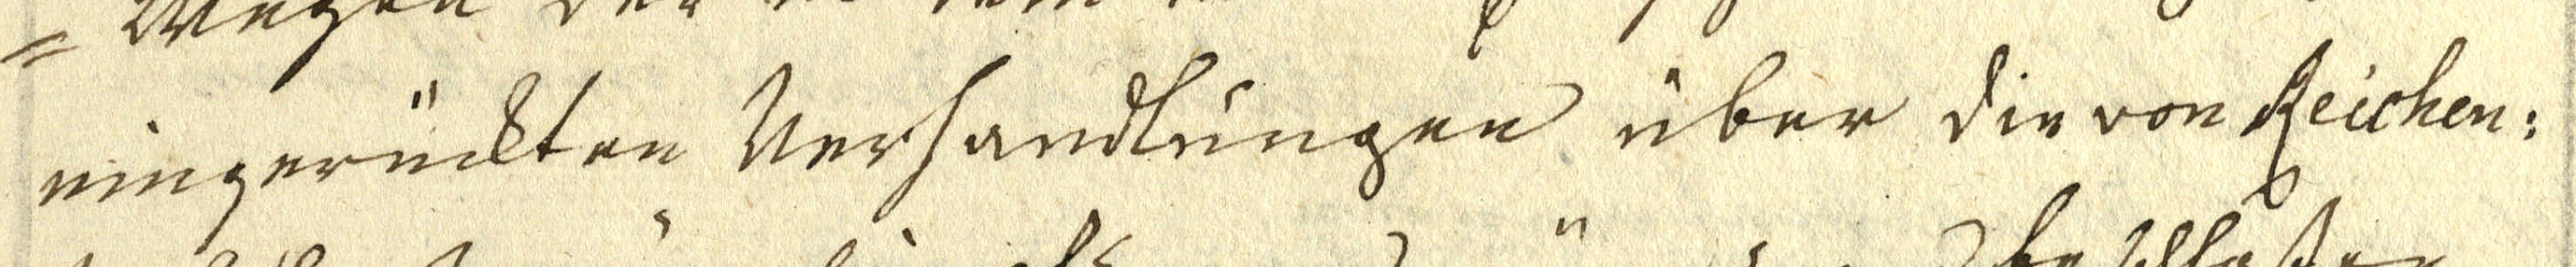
eingerückten Verhandlungen über die von Reichen¬
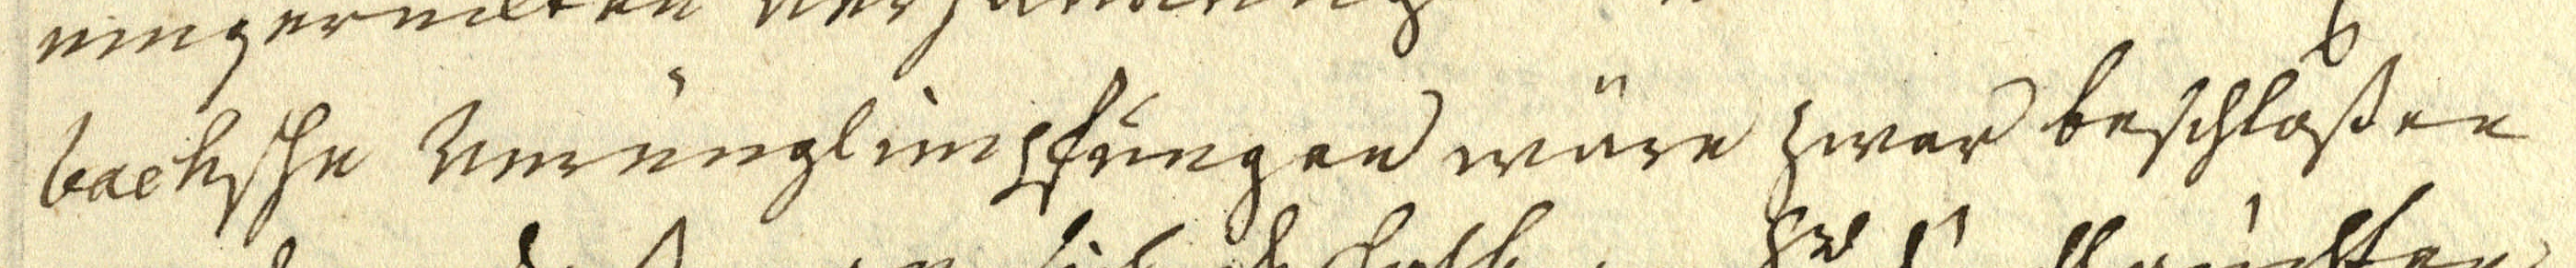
bachsche Verunglimpfungen wäre zwar beschloßen
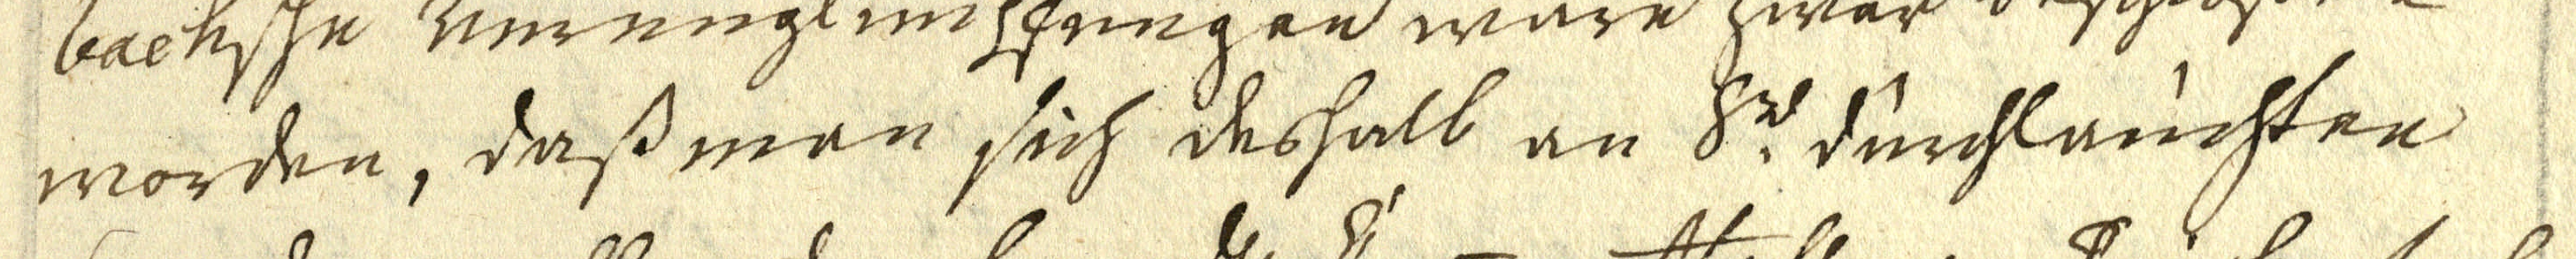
worden, daß man sich deshalb an Sr Durchlauchten
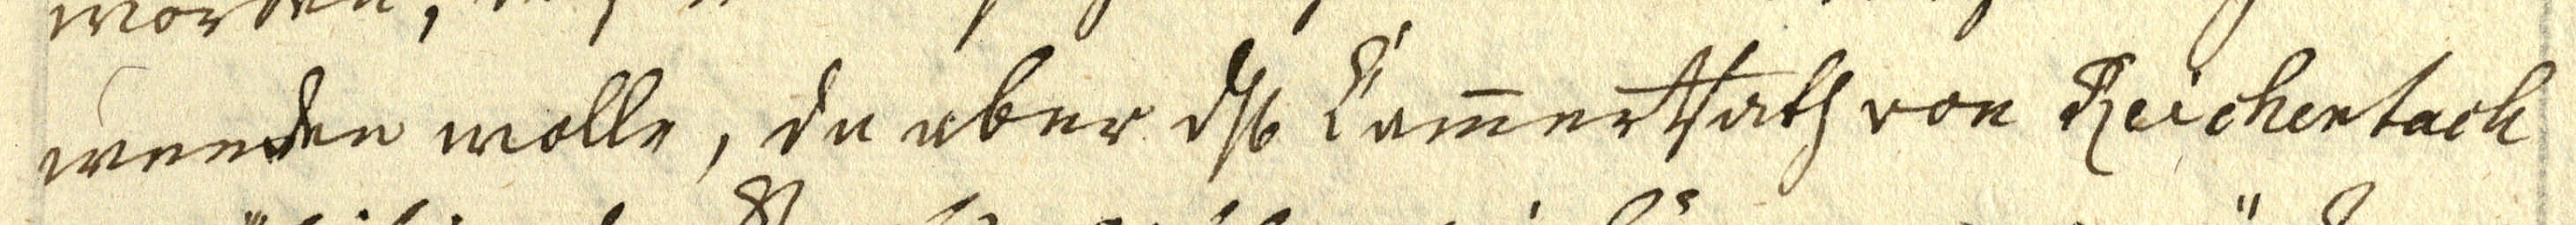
wenden wolle, da aber dh CamerRath von Reichenbach
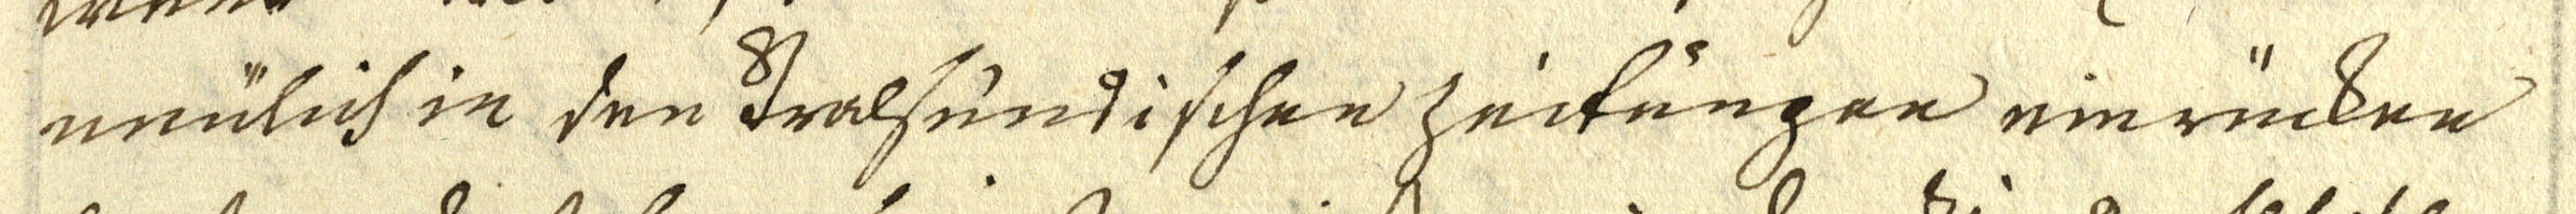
neulich in den Stralsundischen Zeitungen einrücken
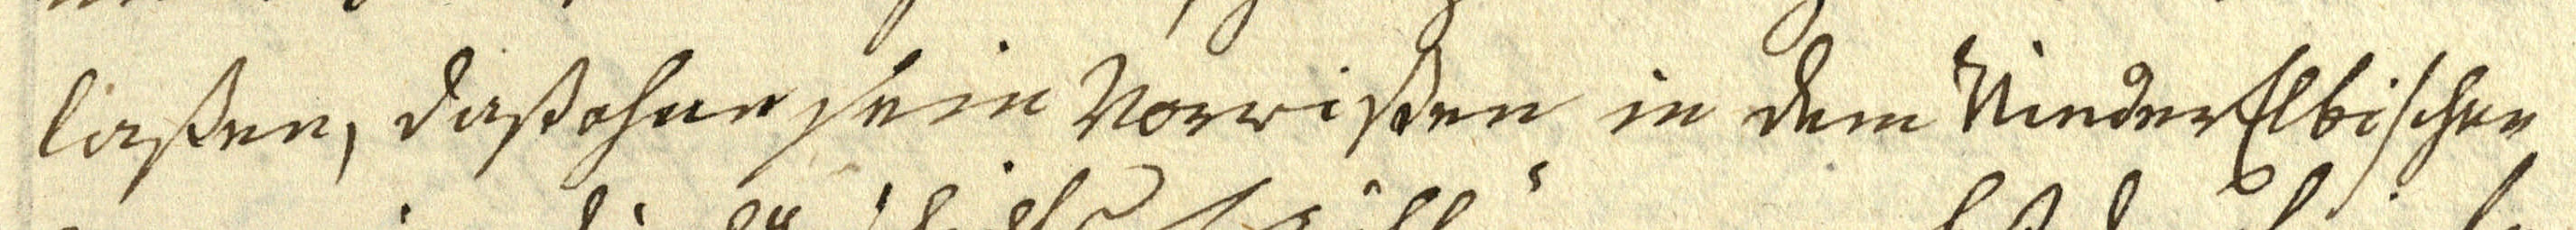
laßen, daß ohne sein Vorwißen in dem NiederElbischen
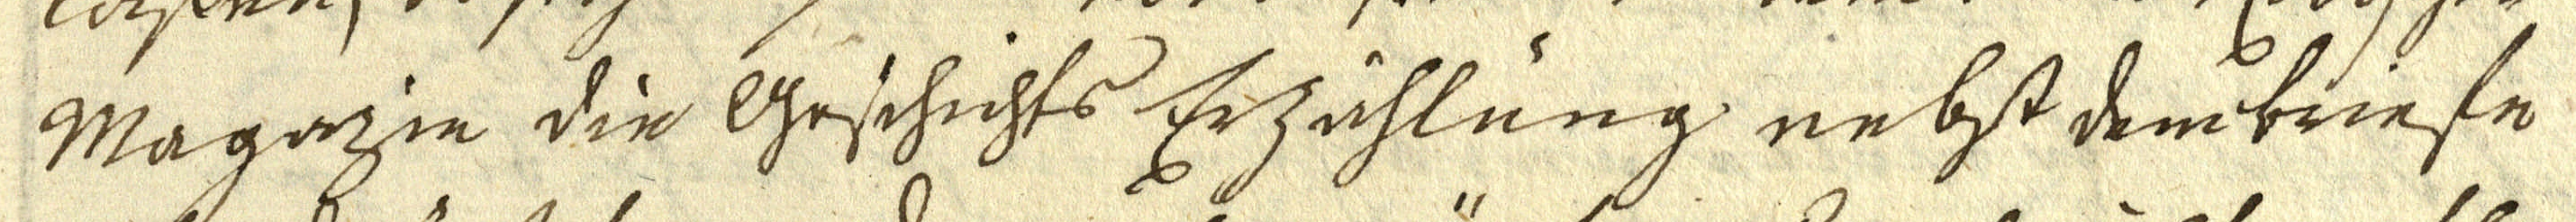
Magazin die Geschichts Erzählung nebst dem Briefe
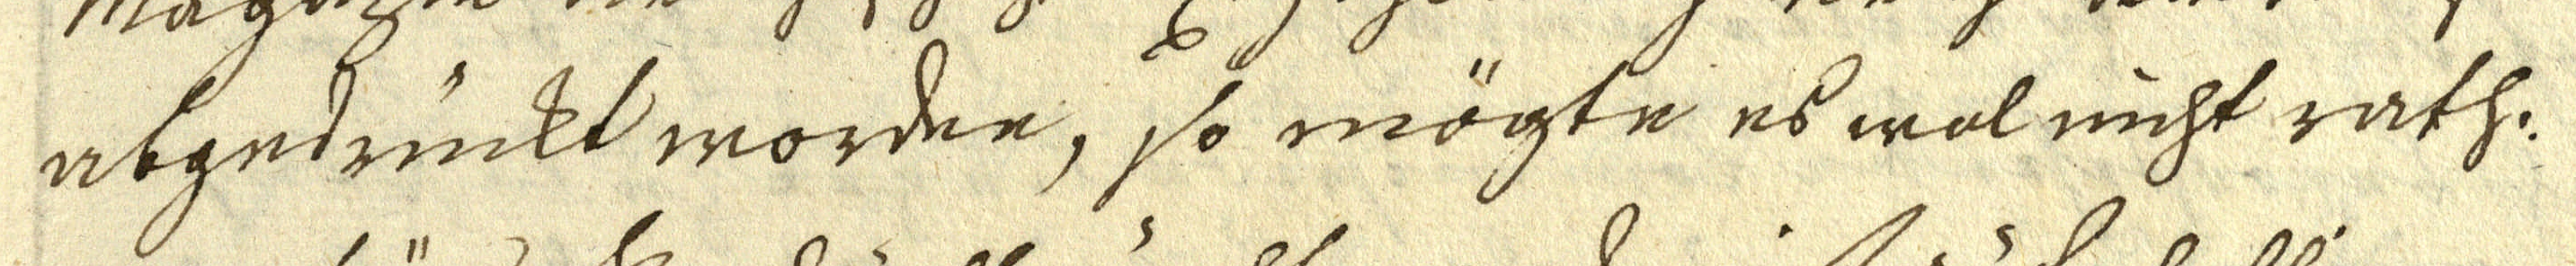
abgedruckt worden, so mögte es wol nicht rath¬
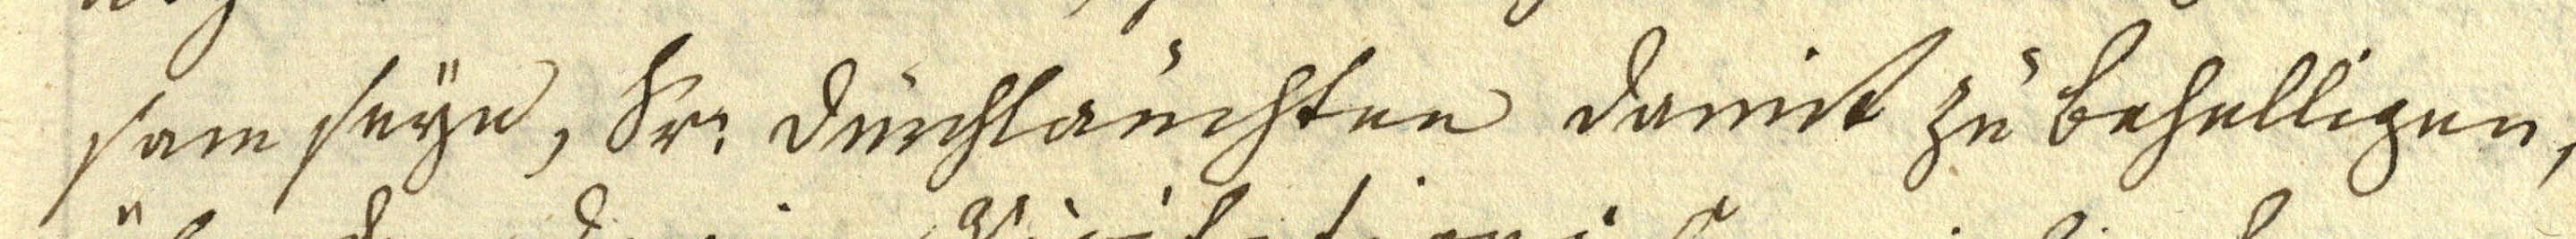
sam seÿn, Sr Durchlauchten damit zu behelligen,
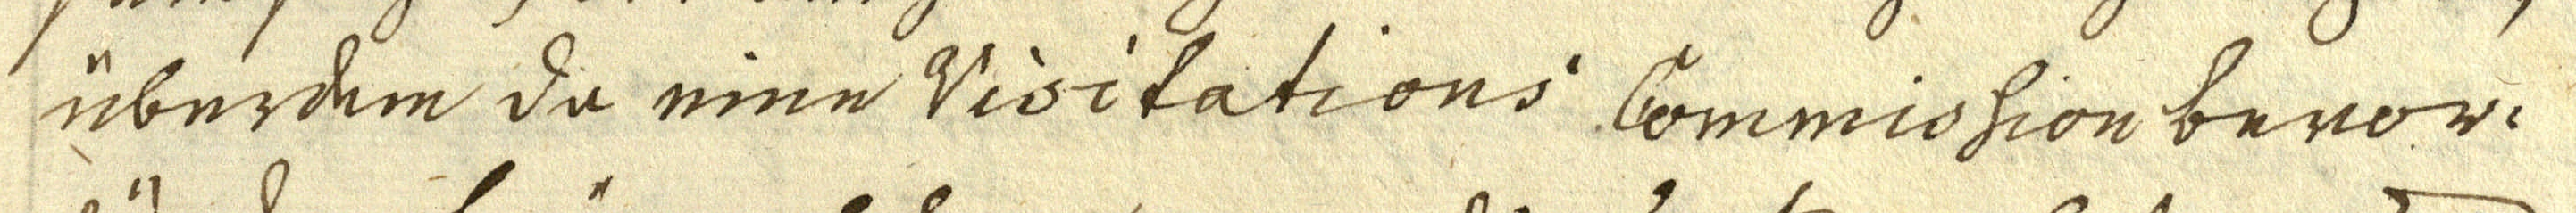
überdem da eine Visitations Commission bevor¬
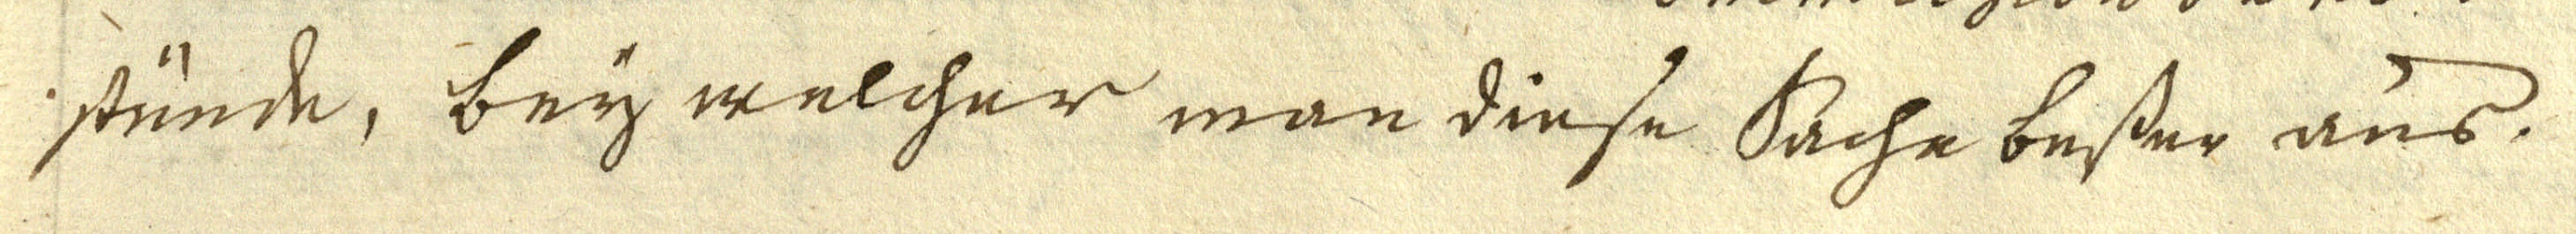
stünde, beÿ welcher man diese Sache besser aus¬
